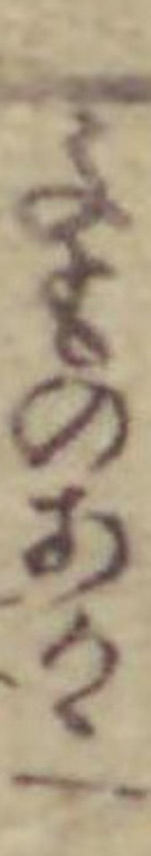よものあかゝ
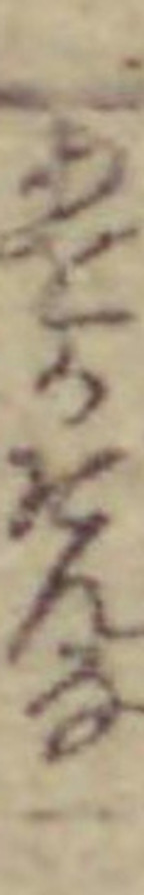あをかそんな
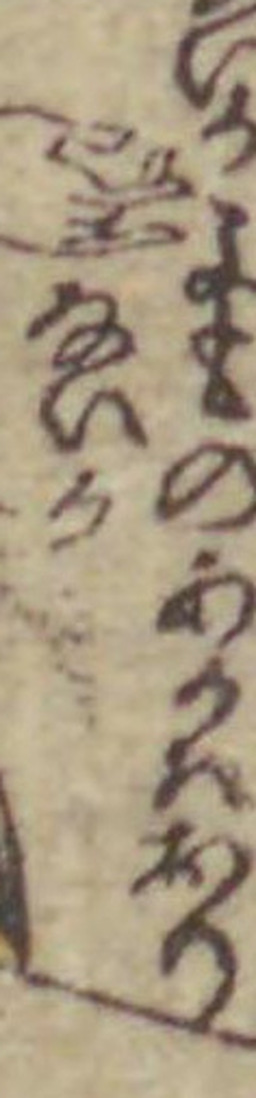ないか
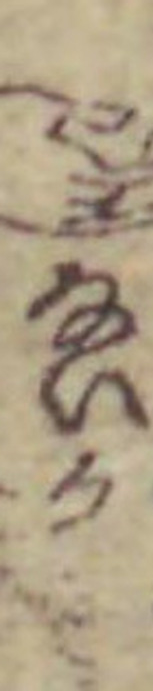ないか
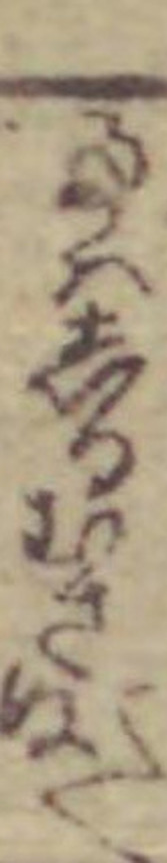事はしるむさぬ
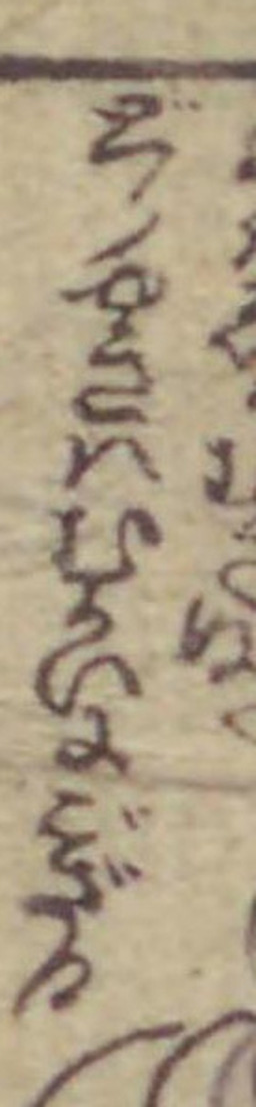どうゆきはむかいにござる

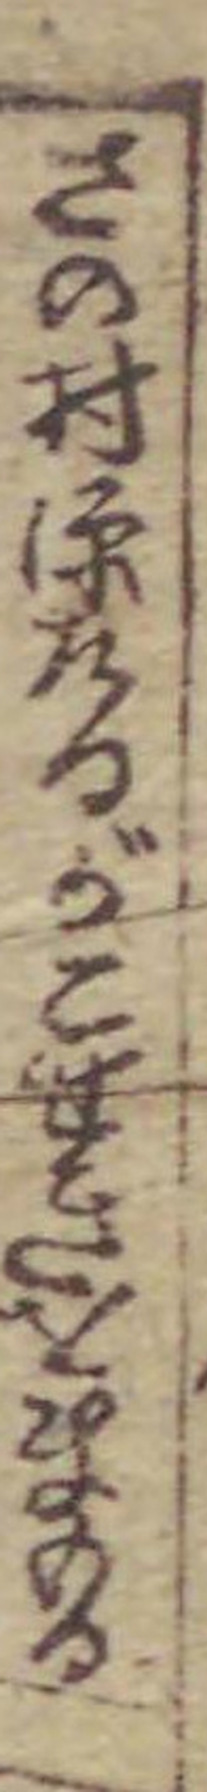さの村源左衛門がこせきをまもる
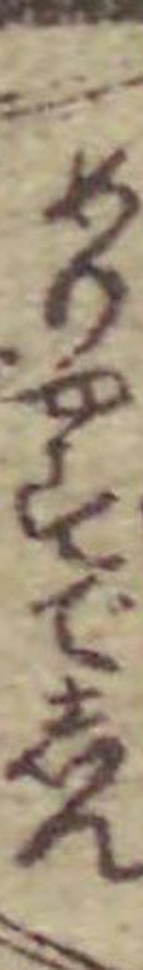めやすでしん
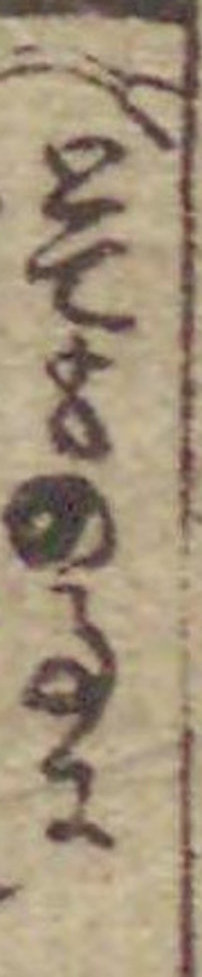とてもの事に
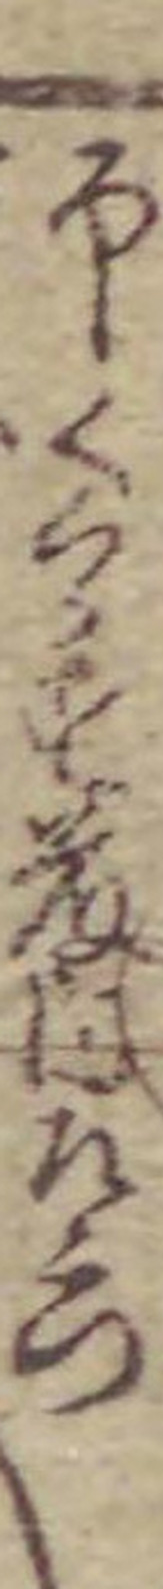ろしくくらす藤内左衛門
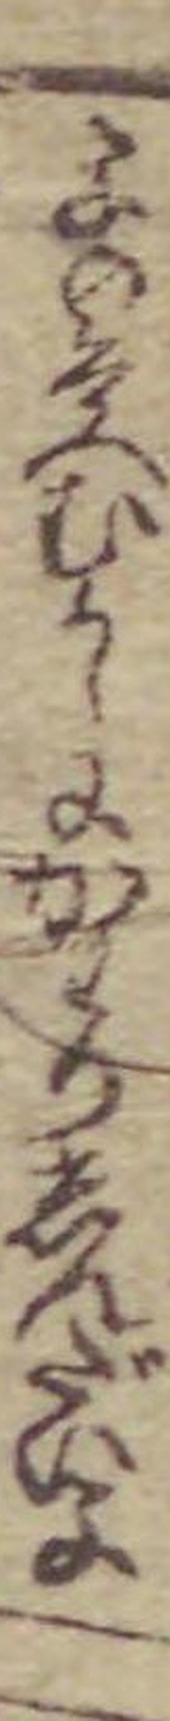よの兵へむかしにかわりしんだいよ
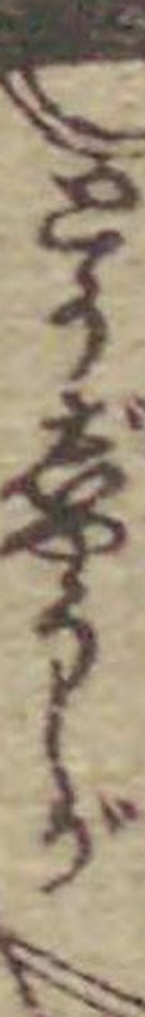うじやうしが
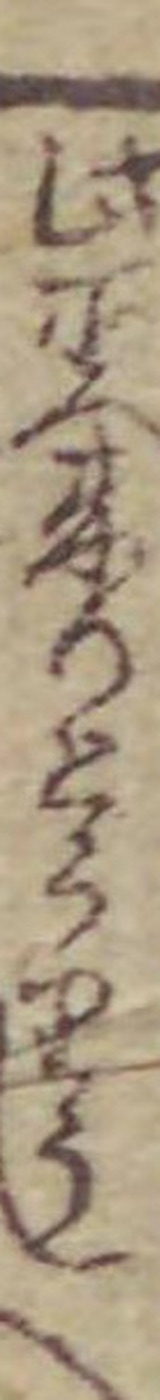此所へ来りとうりうし
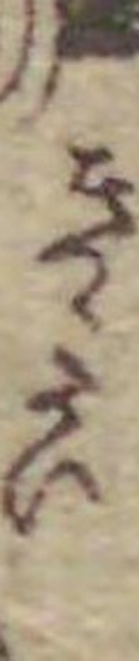きゝたい
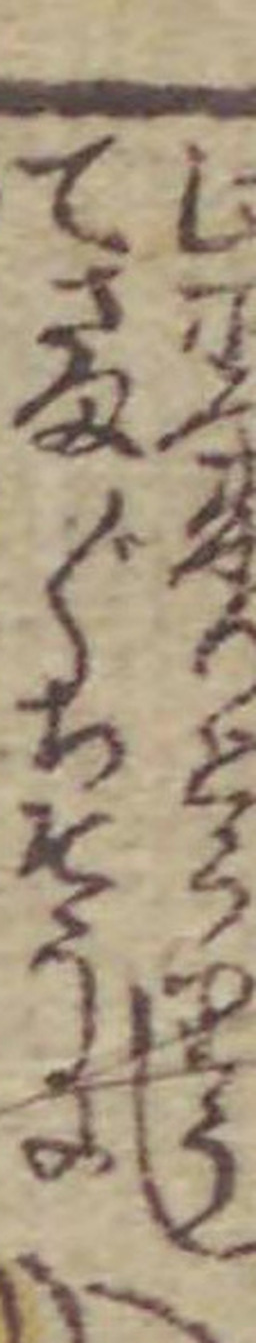てさま〴〵ちそうに
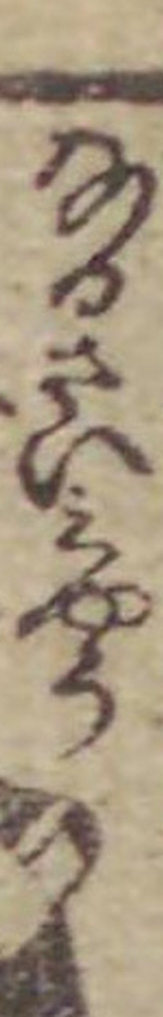なるさいみやう
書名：娜二代鉢木 5巻
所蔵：国立国会図書館 National Diet Library, JAPAN
